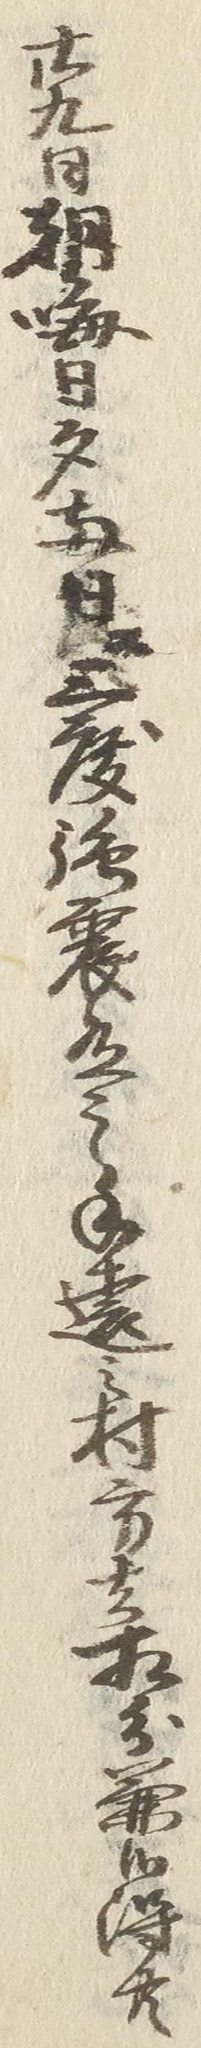廿九日朝晦日夕両日ニ三度強震有之手遠之村方は相分兼候得共
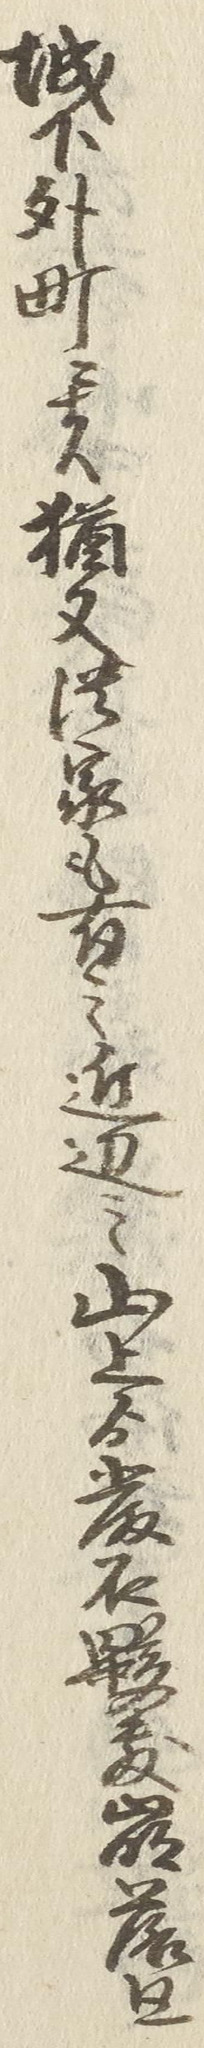城下外町二は猶又潰家も有之近辺之山上より巌石夥敷崩落且
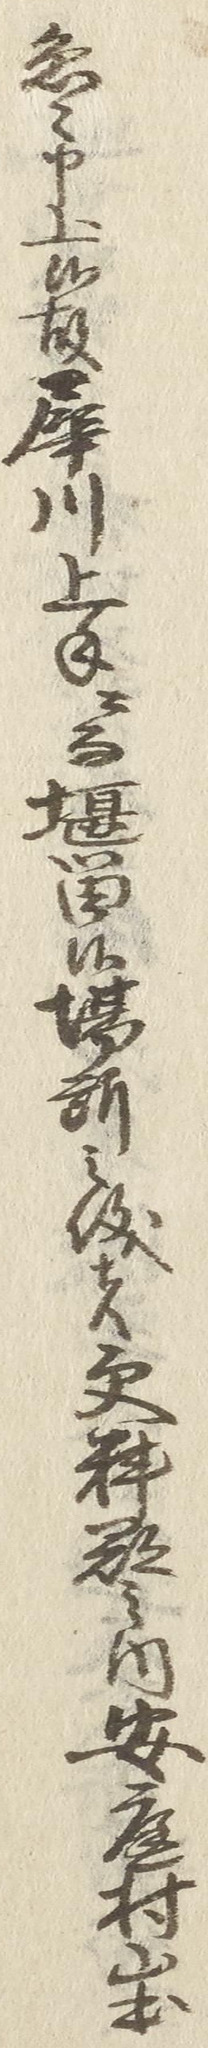急々申上候故犀川上手二而堤留候場所之儀は更級郡之内安庭村山本
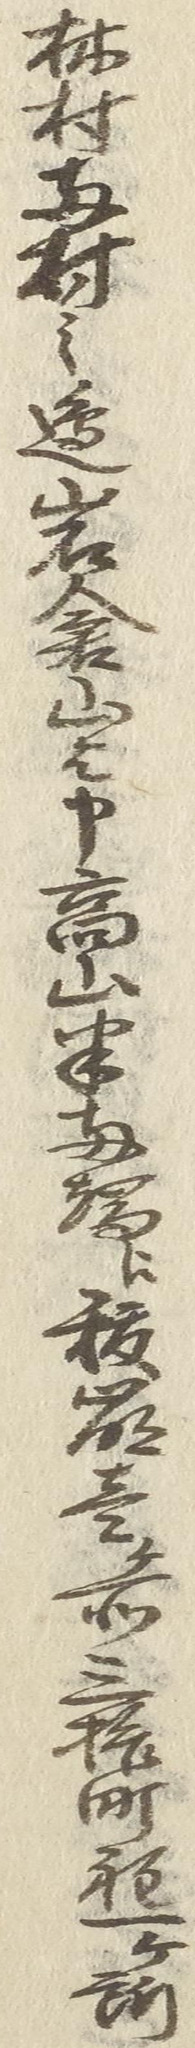平林両村之辺岩倉と申高山半両端江抜崩壱ヶ所三拾町程一ヶ所

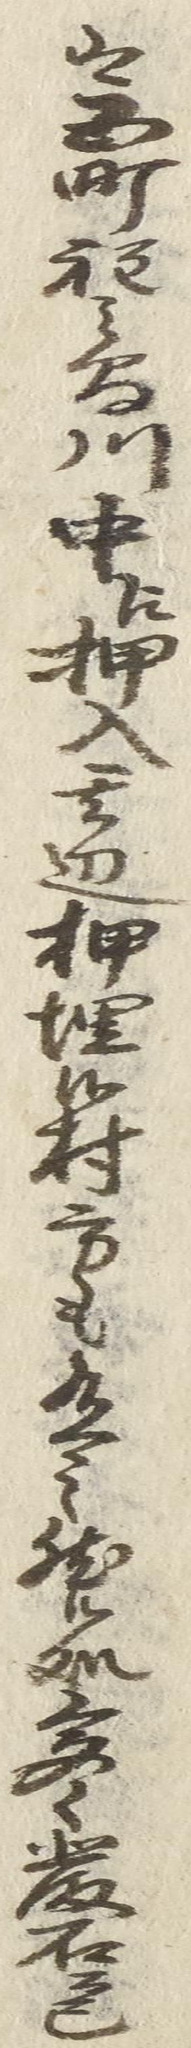は五拾町程之間川中ㇸ押入其辺押埋候村方も有之然ㇽ所多く巌石之而巳
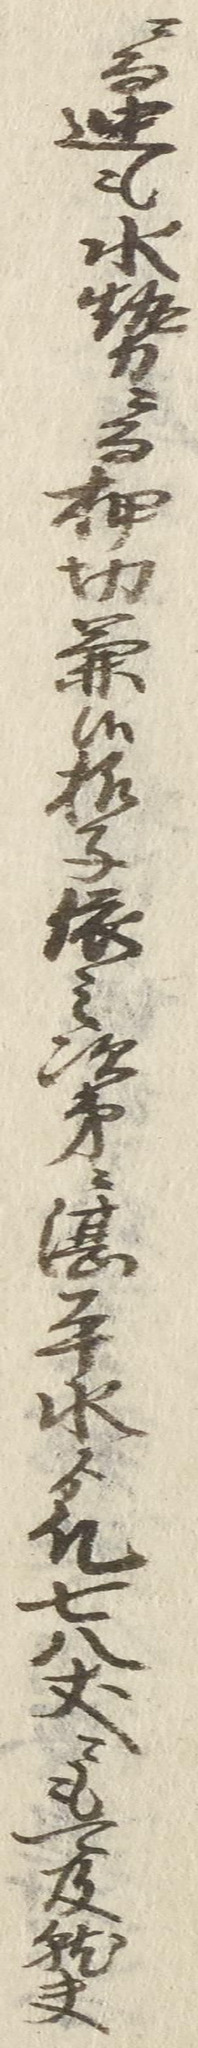二而迚も水勢二而押切兼候様子依之次第二湛平ゟ凡七八丈二も可及就夫
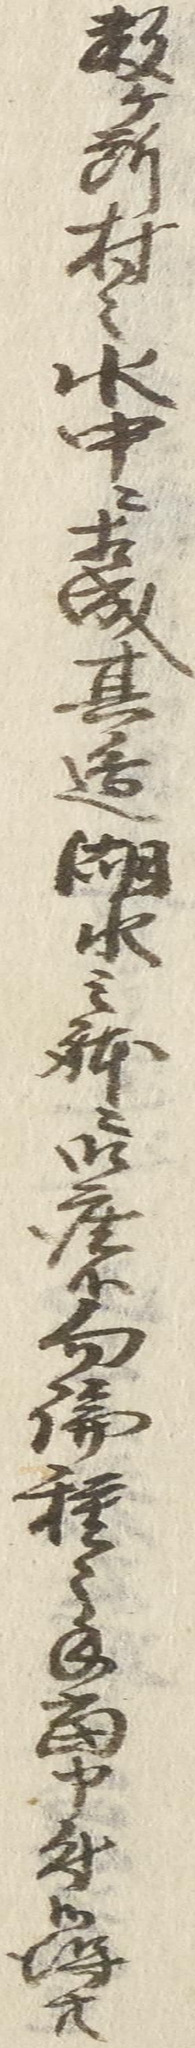数ヶ所村々水中二相成其辺湖水之躰二御座候勿論種々手当申付候得共
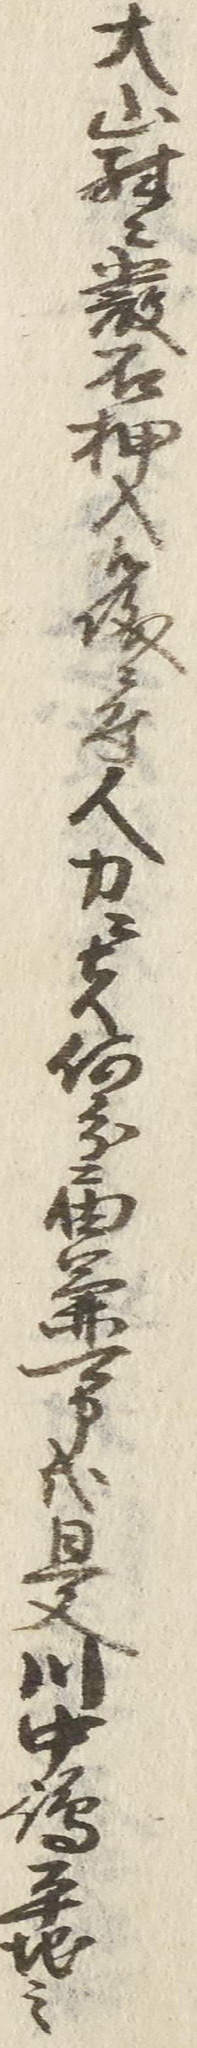大山村々巌石押入候儀二付人力二は何分届兼可申哉且又川中嶋平地之
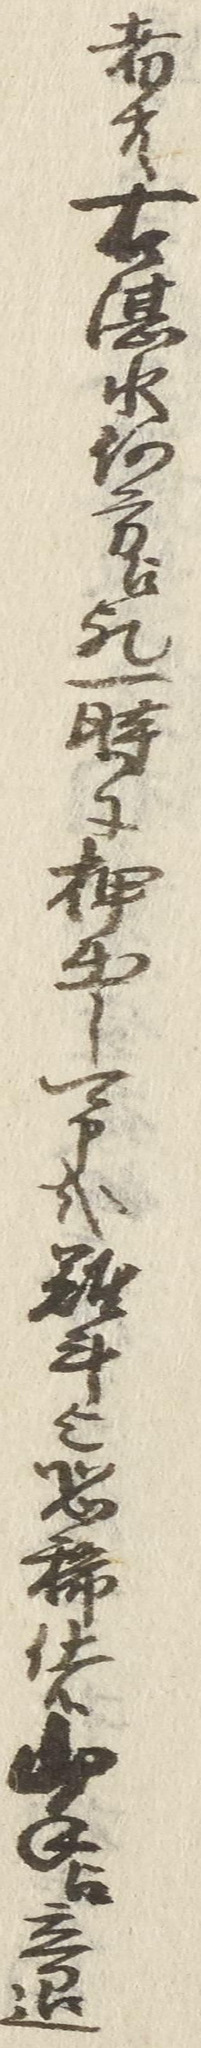者共右湛水何方江歟一時に押出し可申哉難計斗と恐怖仕候山手江立退
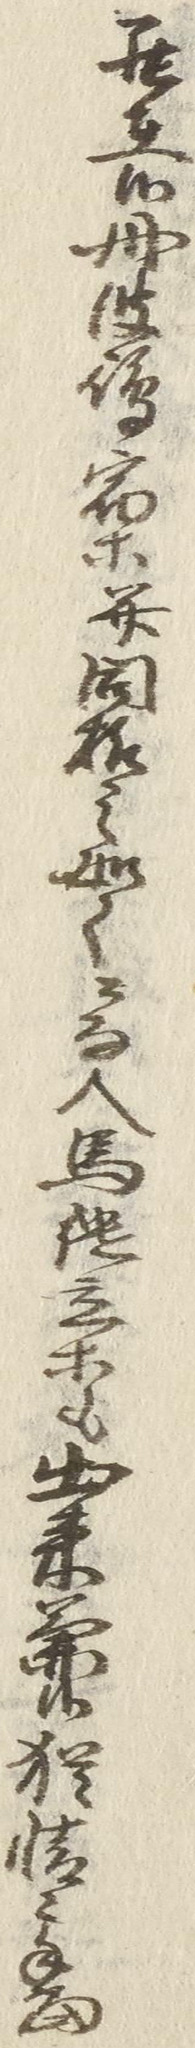罷在候丹波嶋宿等并同様之如く二而人馬継等も出来兼候程精々手当
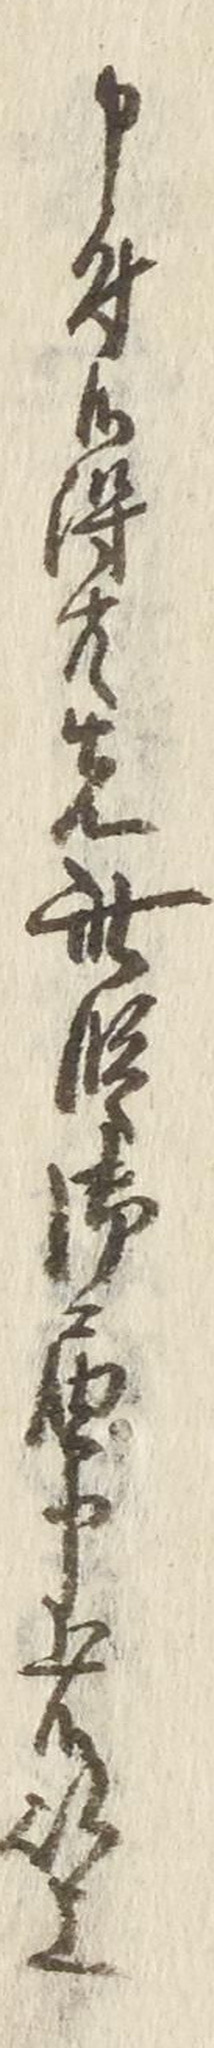申付置候得共先此段御届申上候以上
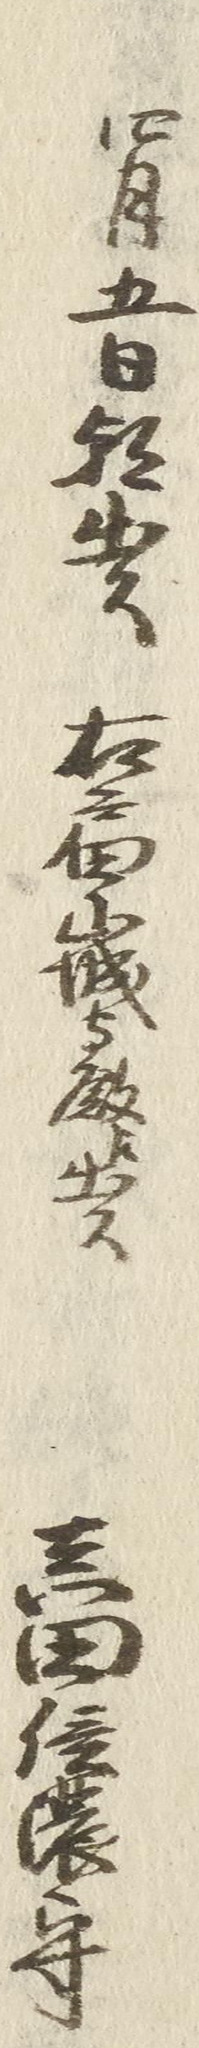四月五日朝出ス右届山城守殿江出ス真田信濃守
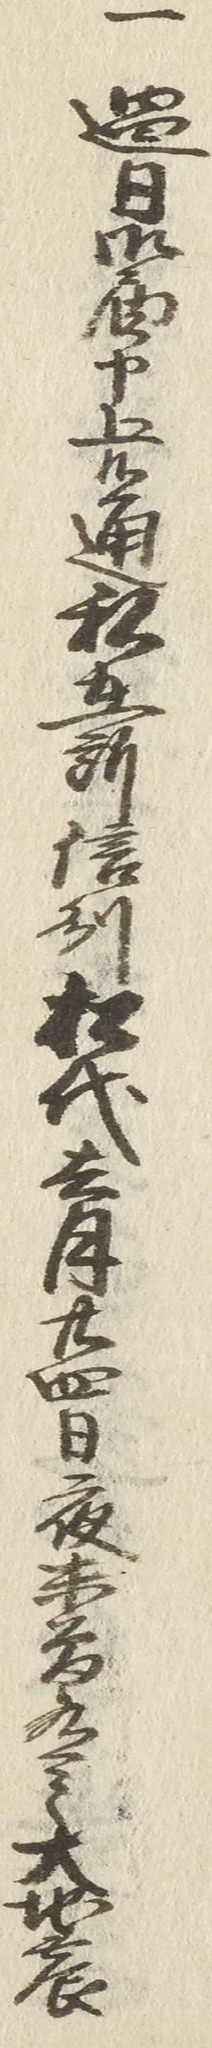一過日御届申上候通私在所信州松代去廿四日夜未曾有之大地震
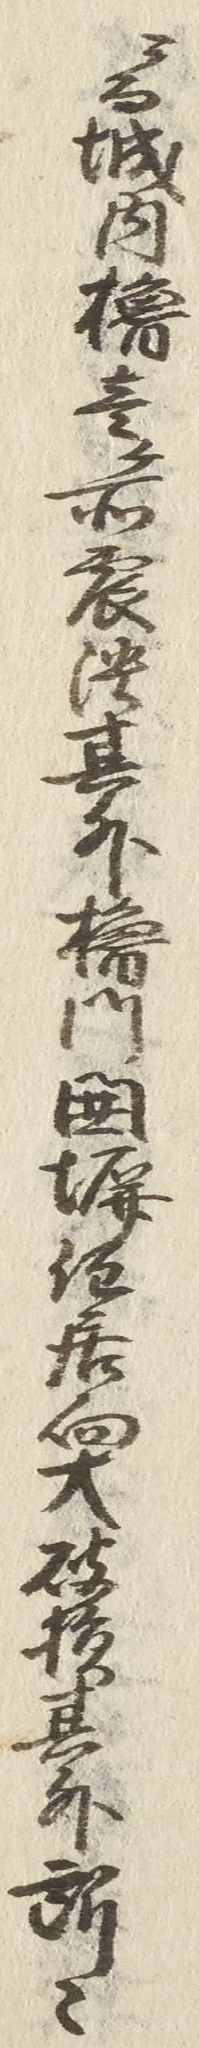二而城内櫓壱ヶ所震潰其外櫓門囲塀住居向大破損其外所々
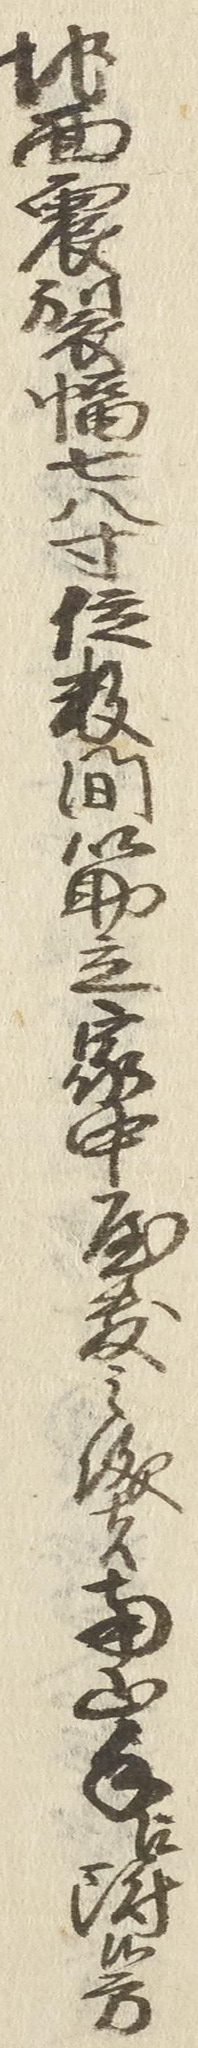地面震裂幅七八寸位数間筋立家中屋敷之儀は南山手江附候方
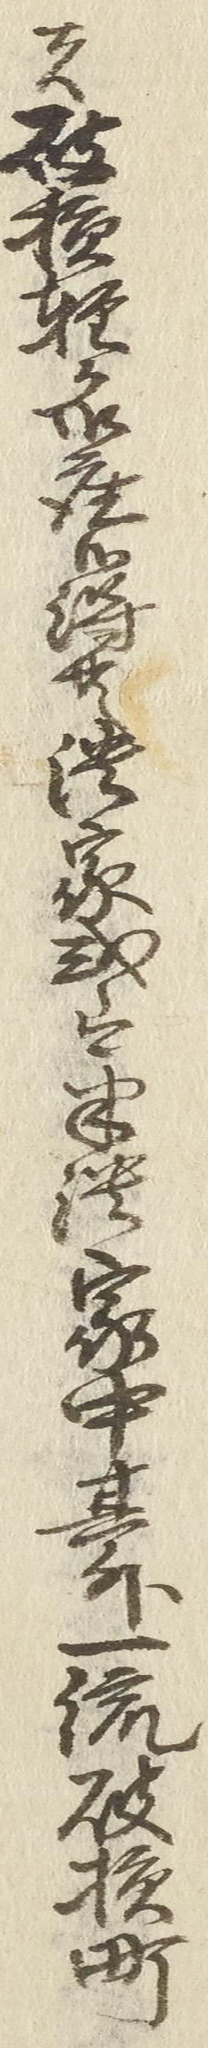は破損軽く御座候得共潰家或は半潰家中其外一統破損町
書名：従往古地震御届書記誌之一
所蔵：東京大学地震研究所図書室 Earthquake Research Institute Library, The University of Tokyo, JAPAN
